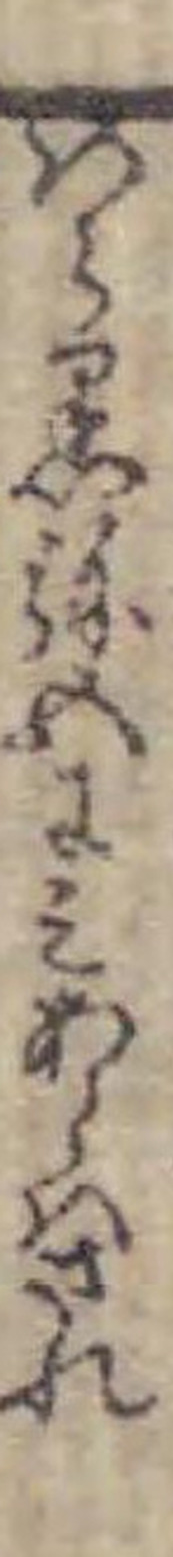はら黒弥五にみあらはされ
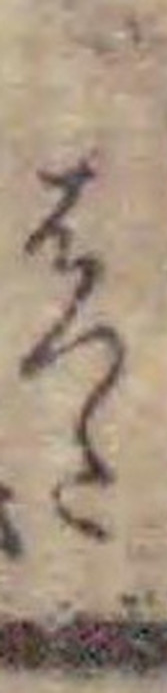はつた
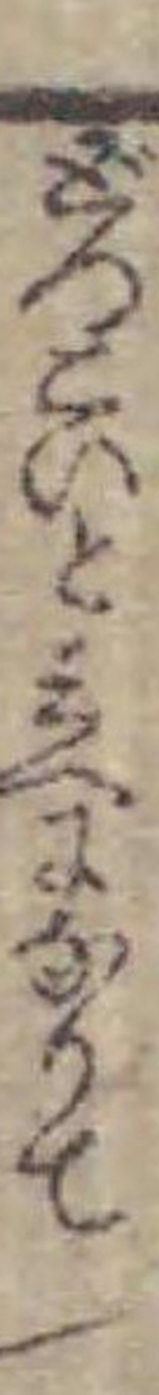どつこいとみへになりて
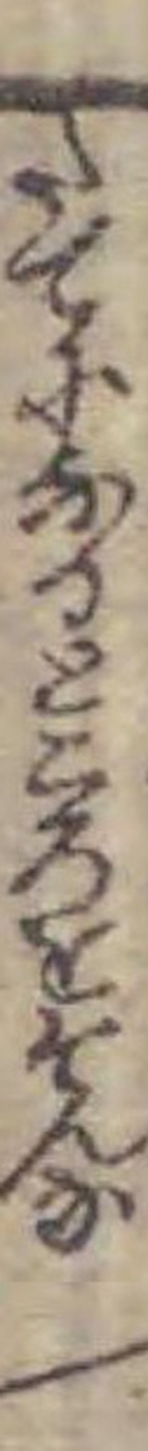たてになるところをそんな
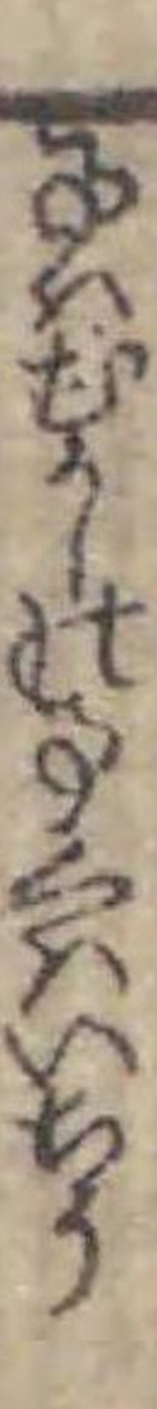事はむかしの事くはいちう
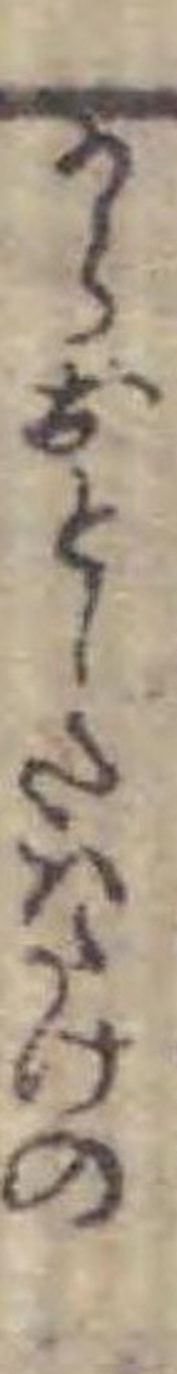からおとしたはたけの
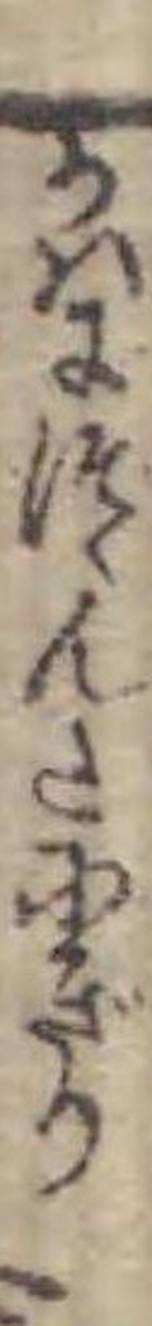かはにつゝんたにぎり
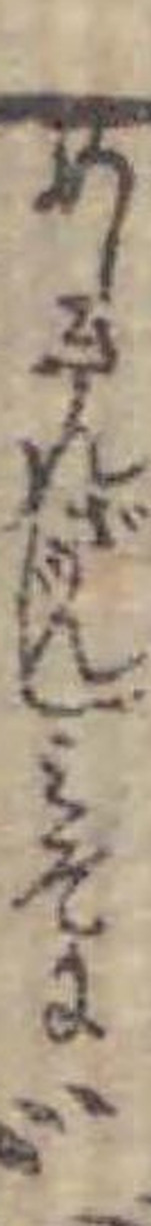めしきんざんしみそに
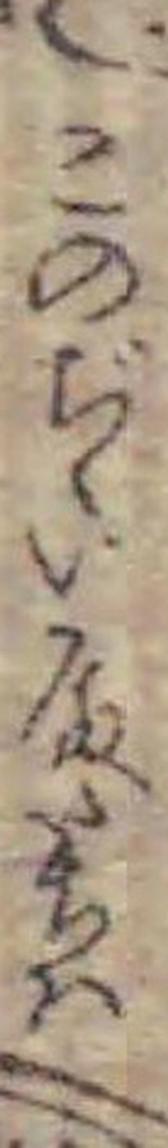このぢゝい殿たちは
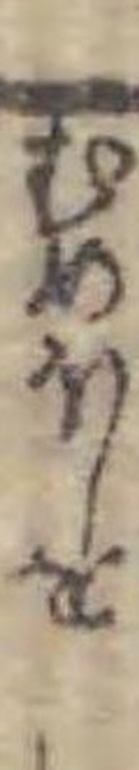むめほしを
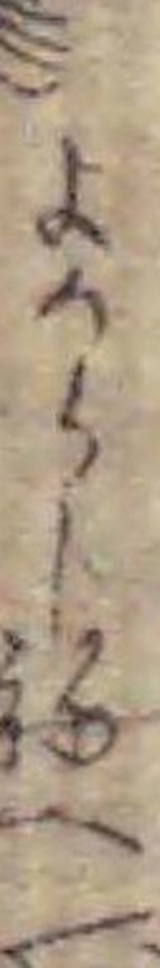よからしねへ
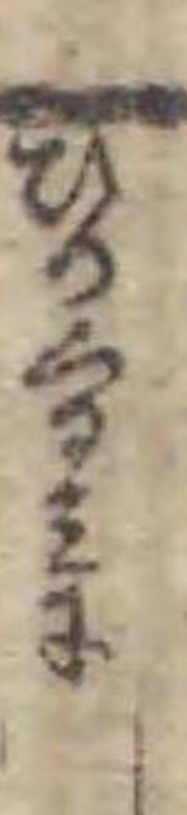ひかるくるみに
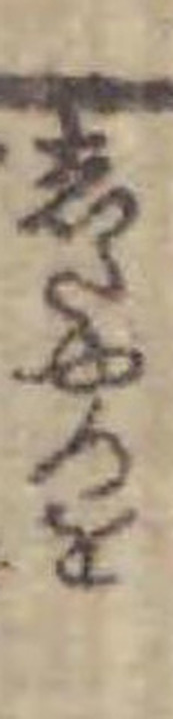したやつを
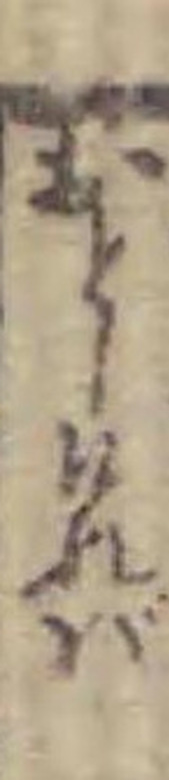おとしければ
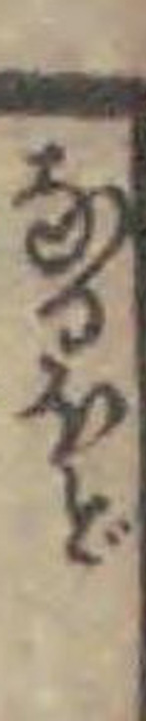なるほど
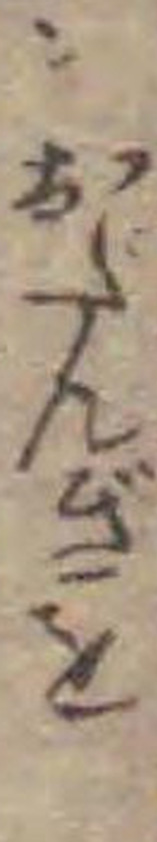おだんぎを
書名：年寄之冷水曽我 : 3巻
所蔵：国立国会図書館 National Diet Library, JAPAN
